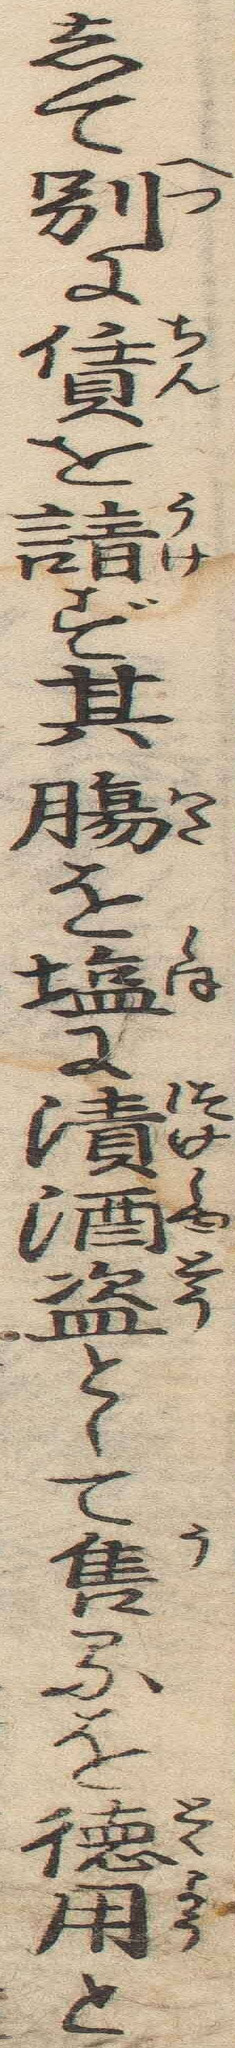して別に賃を請ず其腸を塩に漬酒盗として售るを徳用と
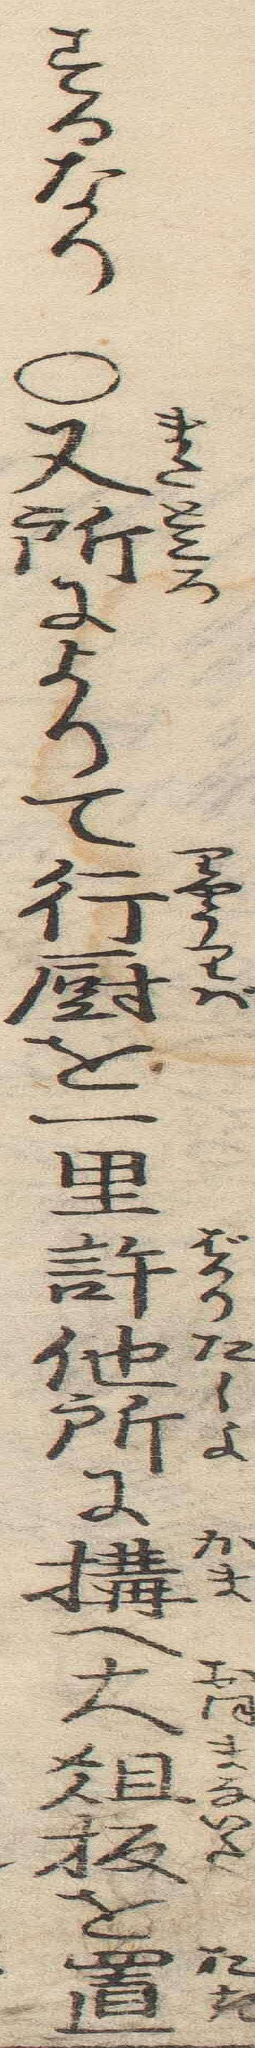するなり○又所によりて行厨を一里許他所に搆へ大俎板を置
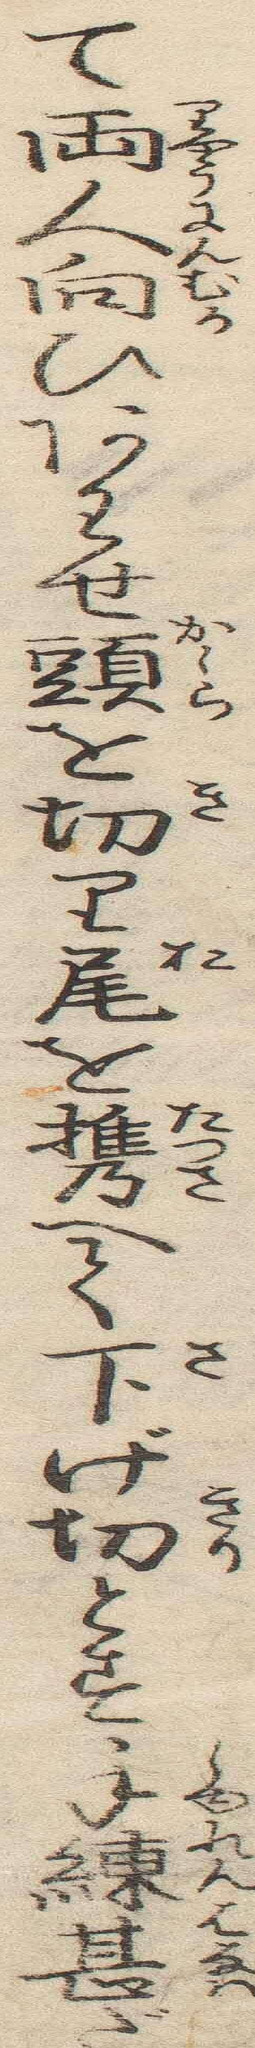て両人向ひあわせ頭を切り尾を携へて下げ切とす手練甚だ
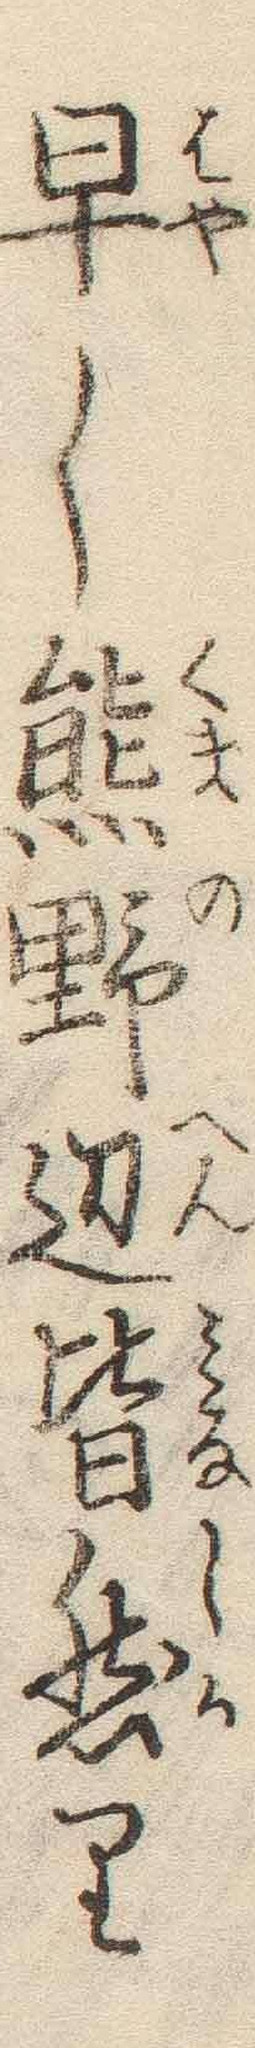早く熊野辺皆然り
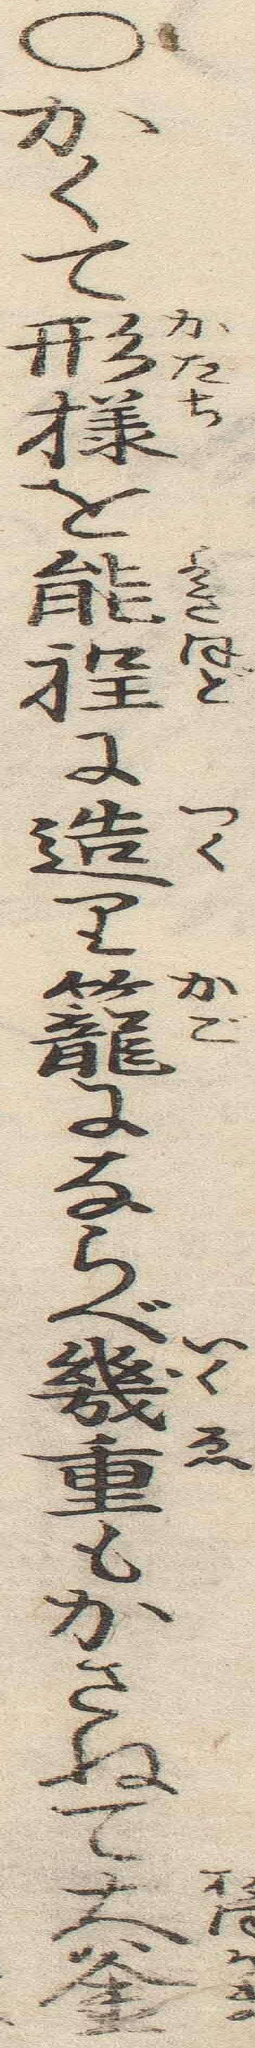○かくて形様を能程に造り籠にならべ幾重もかさねて大釜
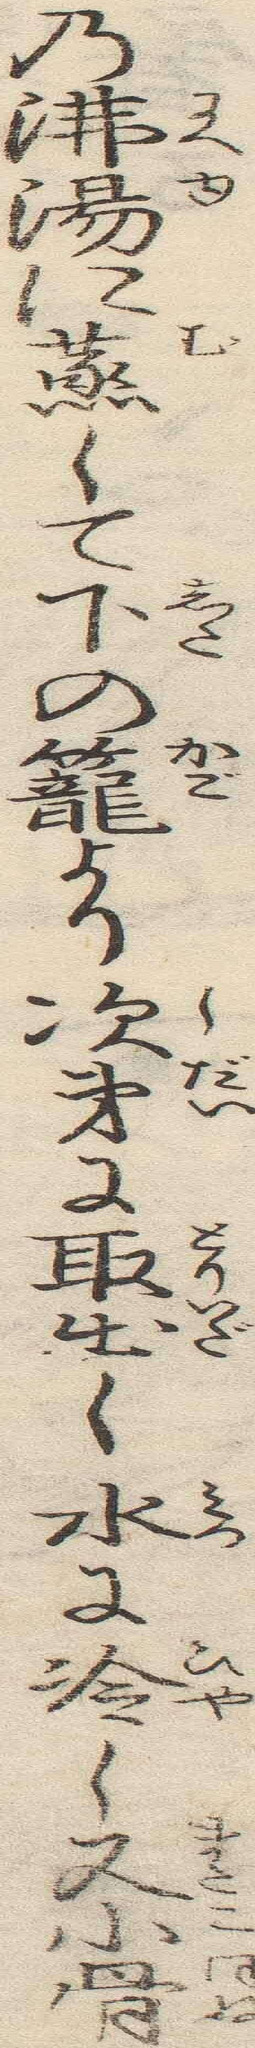の沸湯に蒸して下の籠より次第に取出し水に冷し又小骨
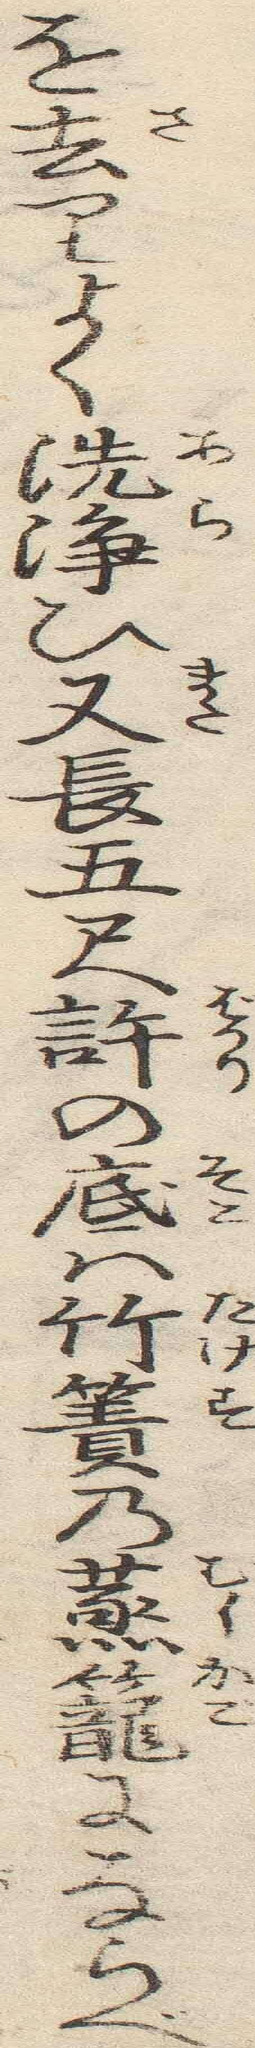を去りよく洗浄ひ又長五尺許の底は竹簀の蒸籠にならべ
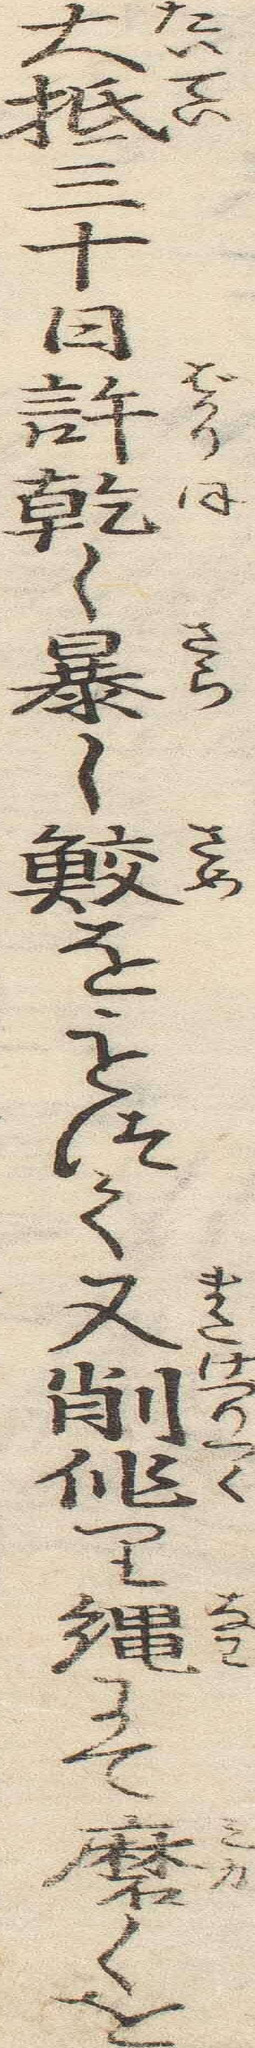大抵三十日許乾し暴し鮫をもつて又削作り縄にて磨くを
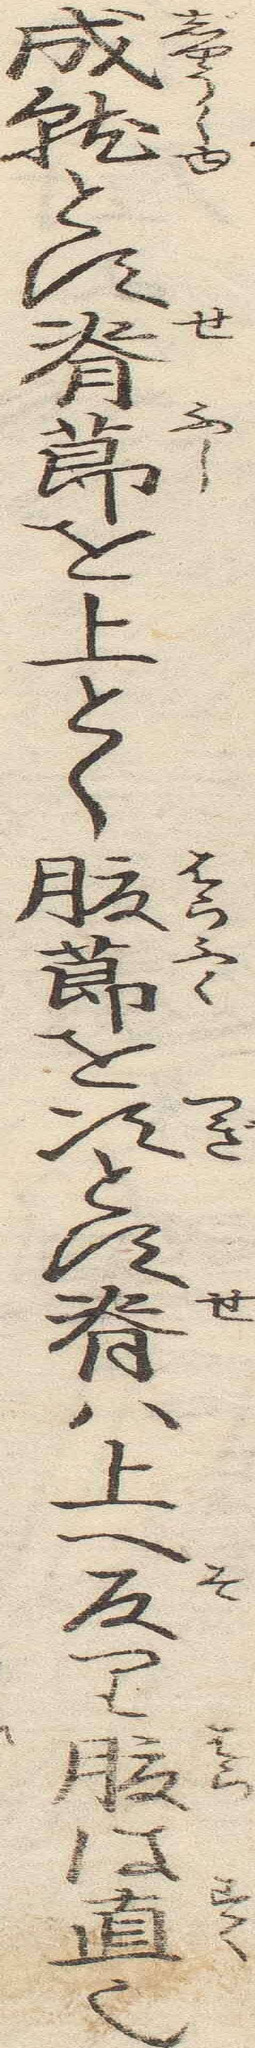成就とす脊節を上とし腹節を次とす脊は上へ反り腹は直也
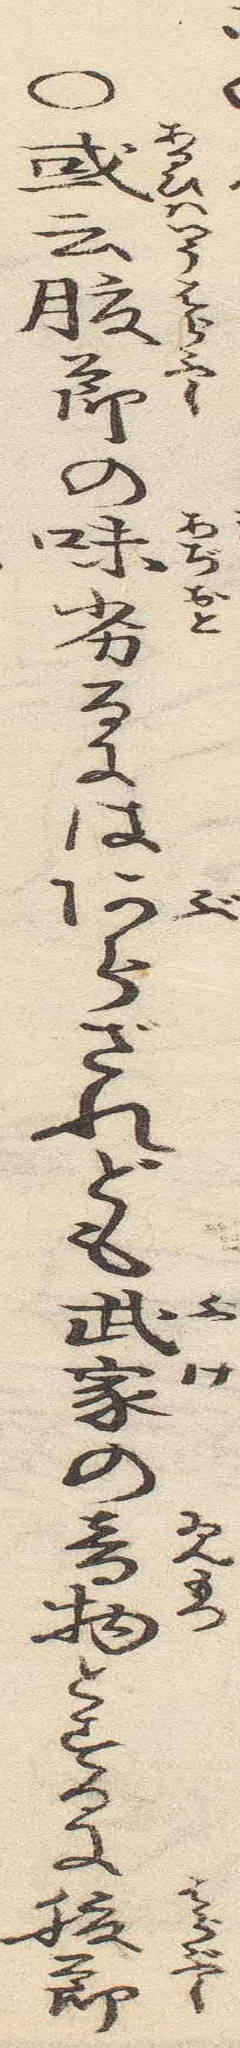○或云腹節の味劣るにはあらざれども武家の音物とするに腹節
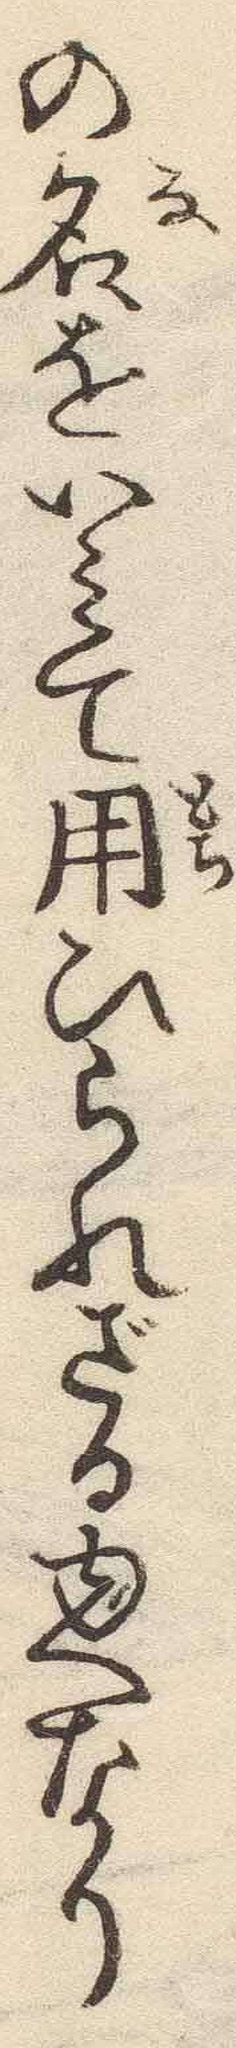の名をいみて用ひられざるゆへなり
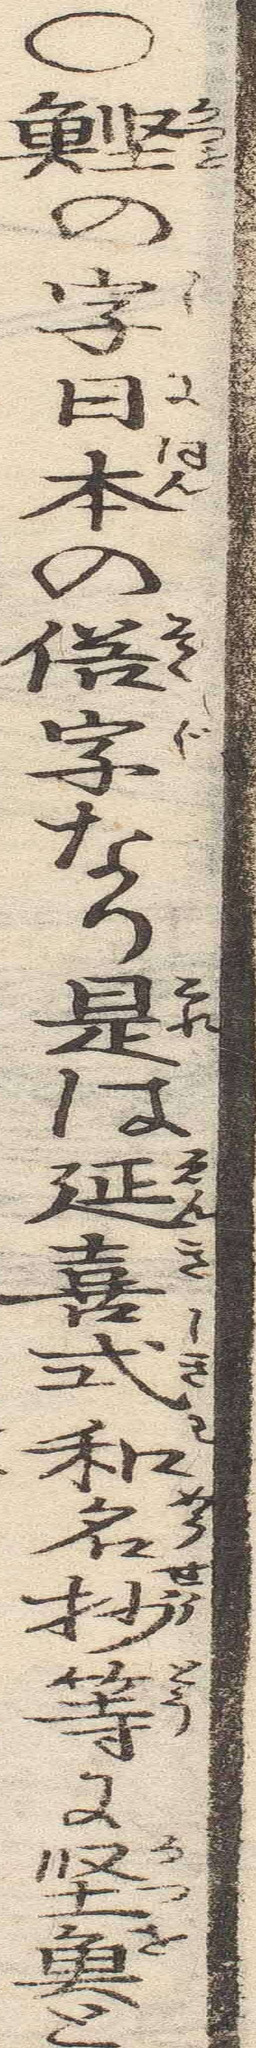○鰹の字日本の俗字なり是は延喜式和名抄等に堅魚と
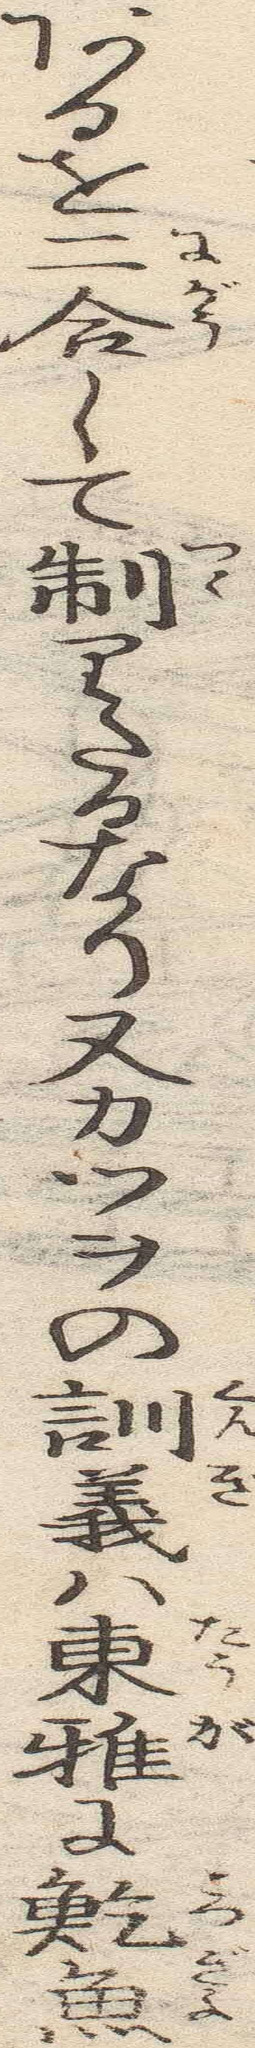あるを二合して制りたるなり又カツヲの訓義は東雅に䰴魚
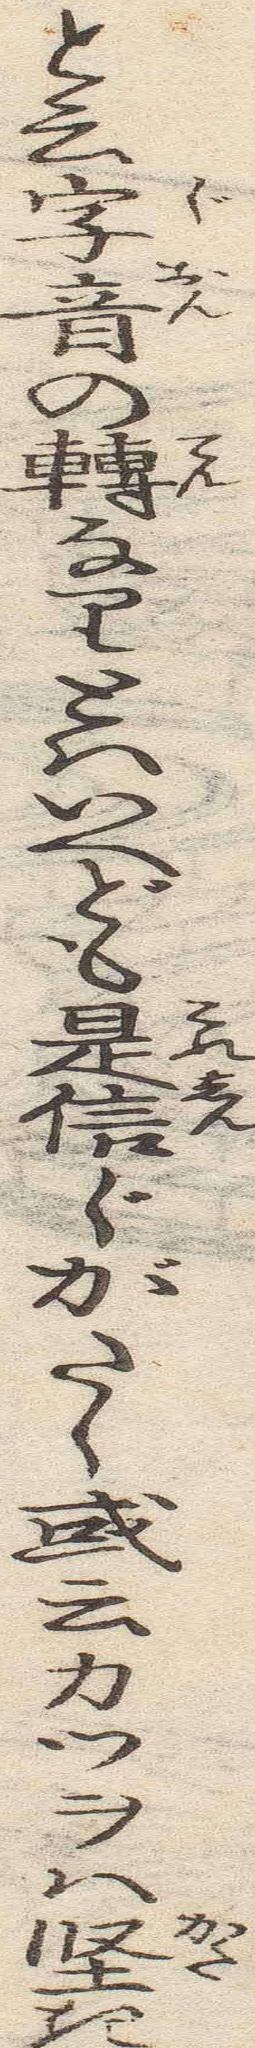と云字音の転なりとはいへども是信じがたし或云カツヲは堅き
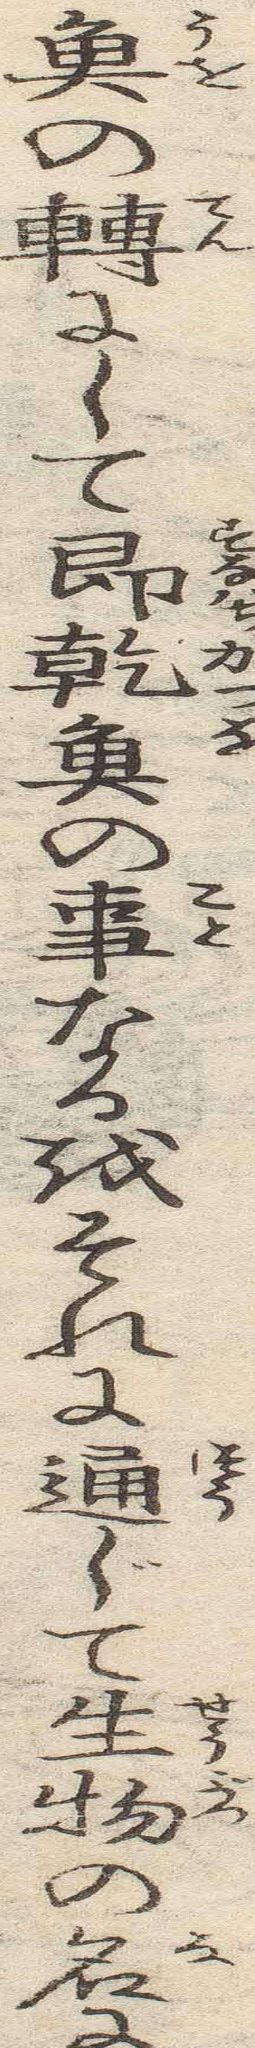魚の転にして即乾魚の事なるをそれに通じて生物の名に
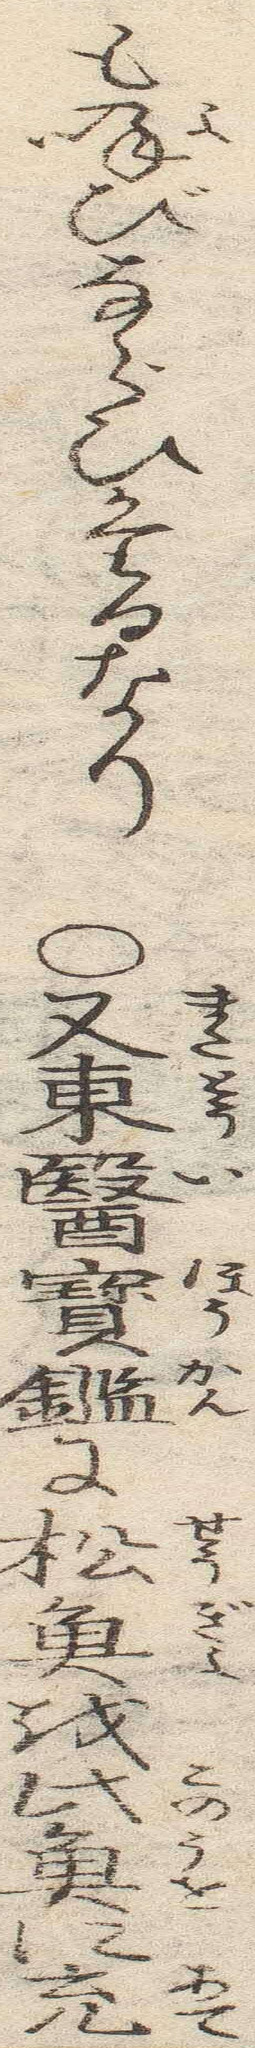も呼びならひたるなり○又東医宝鑑に松魚を此魚に充
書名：日本山海名産図会
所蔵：東京学芸大学附属図書館 国文学研究資料館
